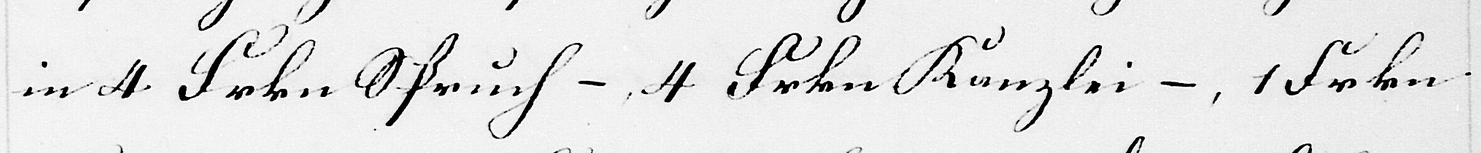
in 4. Frkn Spruch-, 4 Frkn Kanzlei-, 1 Frkn
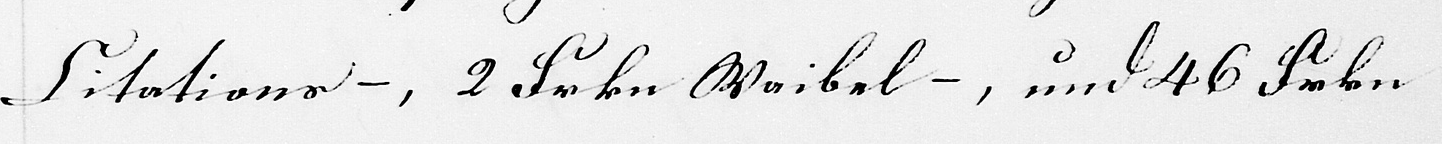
Citations-, 2 Frkn Waibel-, und 46 Frkn
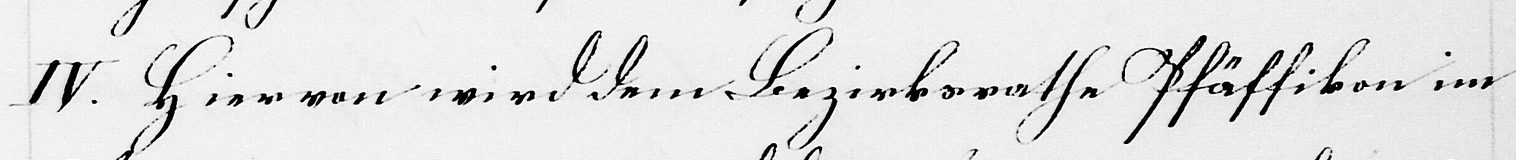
IV. Hiervon wird dem Bezirksrathe Pfäffikon im
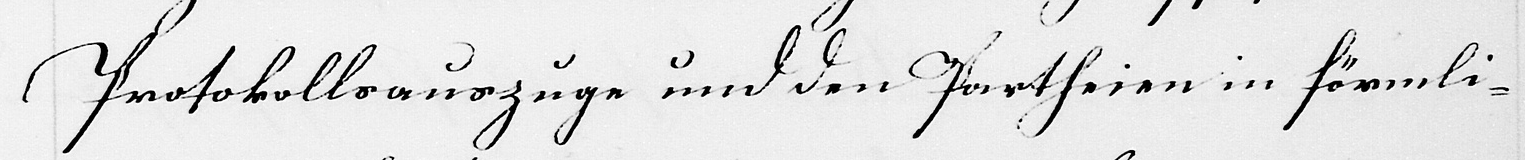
Protokollsauszuge und den Partheien in förmli¬
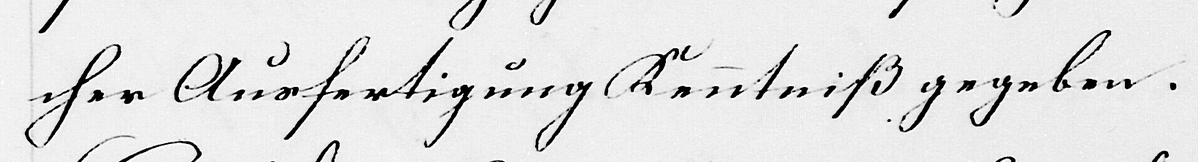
cher Ausfertigung Kenntniß gegeben.
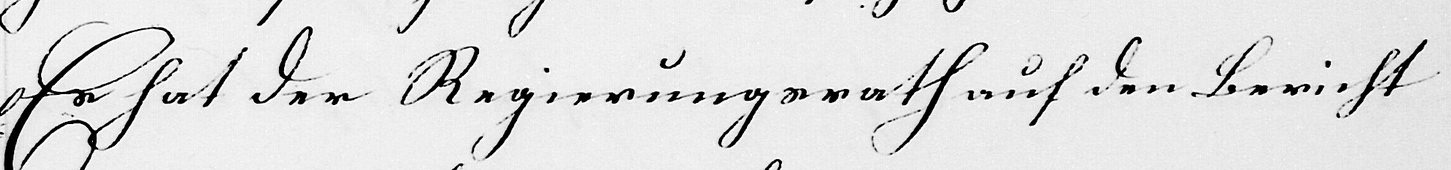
Es hat der Regierungsrath auf den Bericht
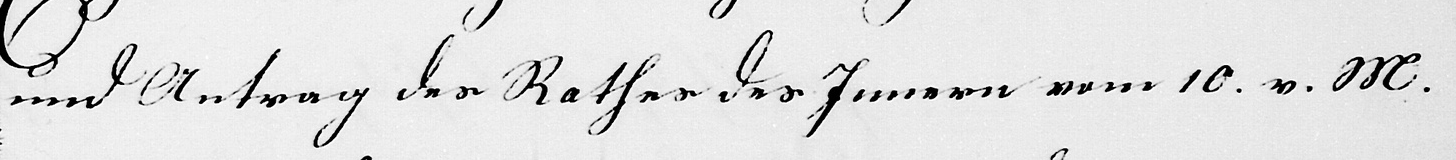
und Antrag des Rathes des Innern vom 10. v. M.
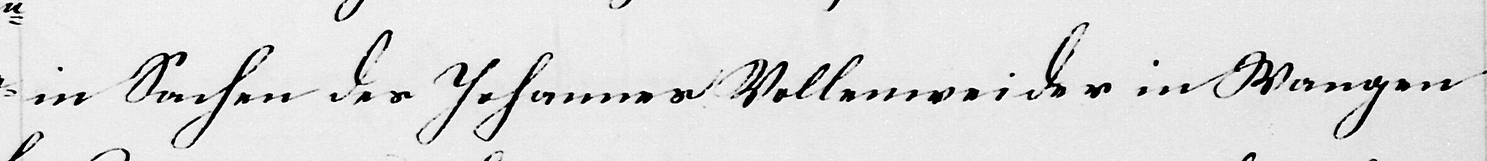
in Sachen des Johannes Vollenweider in Wangen
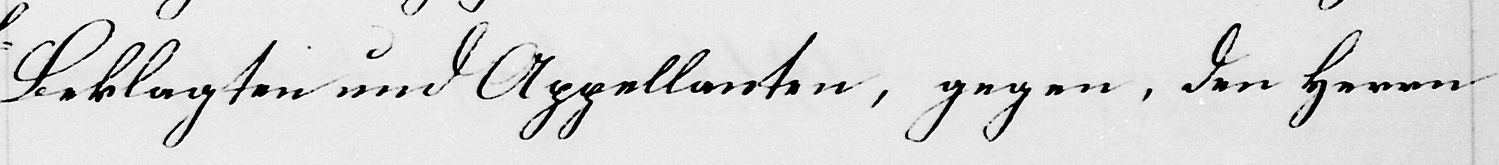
Beklagten und Appellanten, gegen, den Herrn
